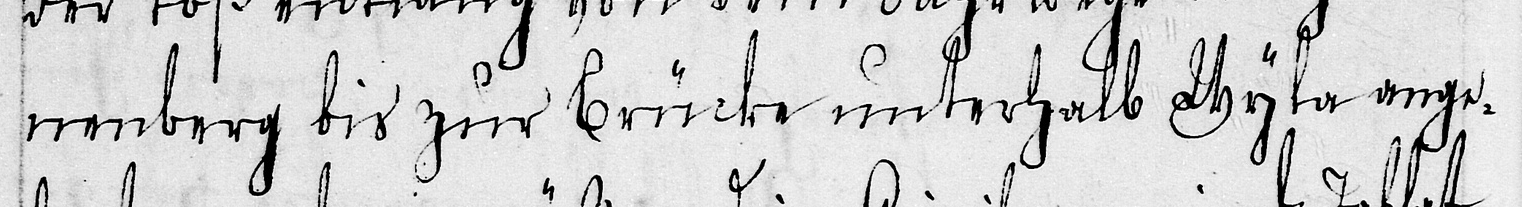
nenberg bis zur Brücke unterhalb Wyla ange¬
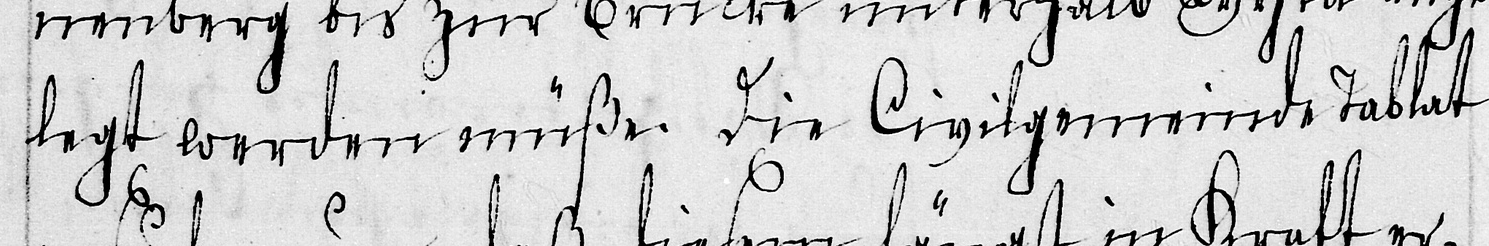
legt werden müße. Die Civilgemeinde Tablat
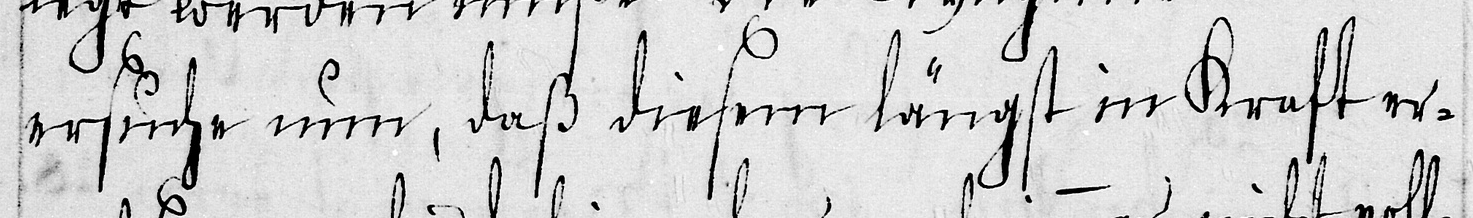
ersuche nun, daß diesem längst in Kraft er¬
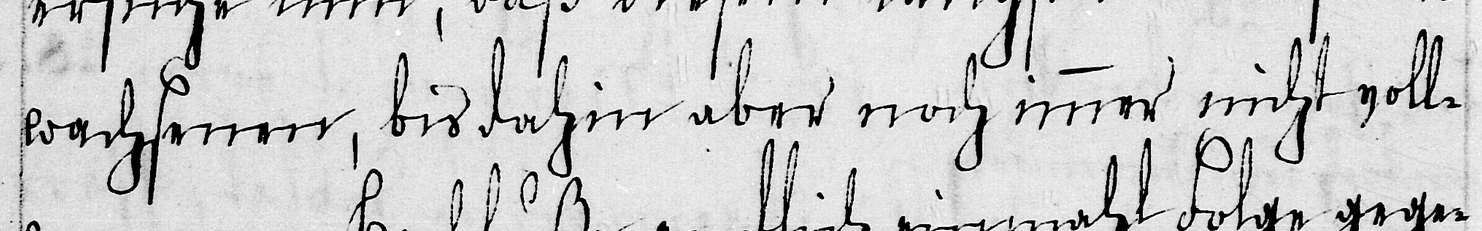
wachsenen, bis dahin aber noch immer nicht voll¬
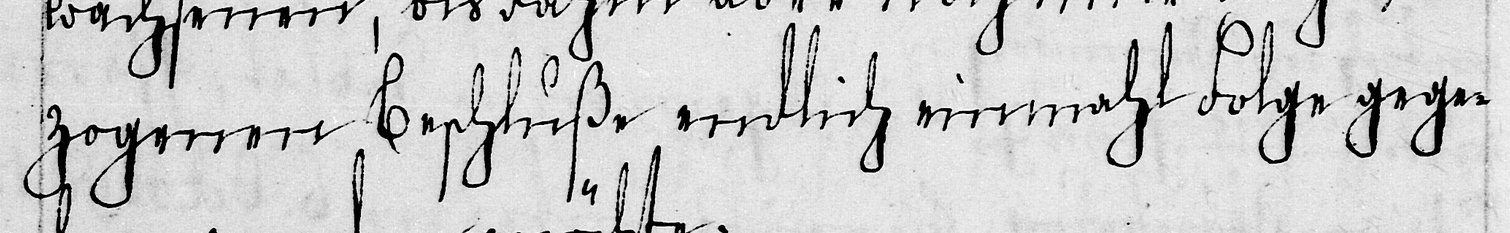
zogenen Beschluße endlich einmahl Folge gege¬
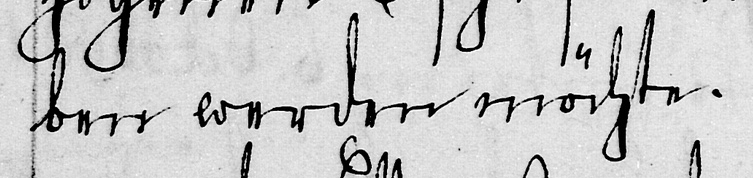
ben werden möchte.
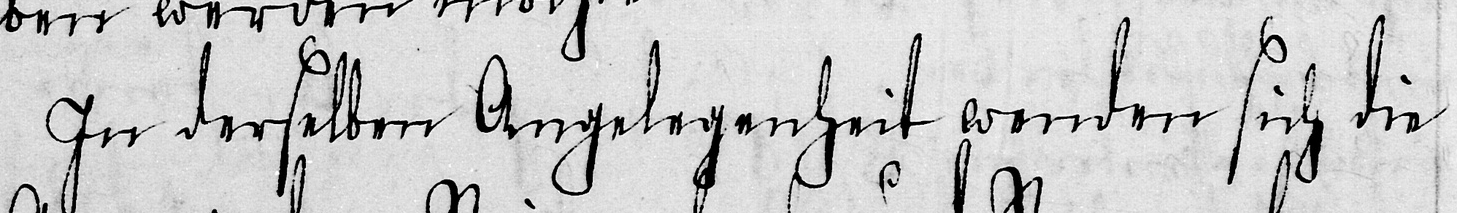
In derselben Angelegenheit wenden sich die
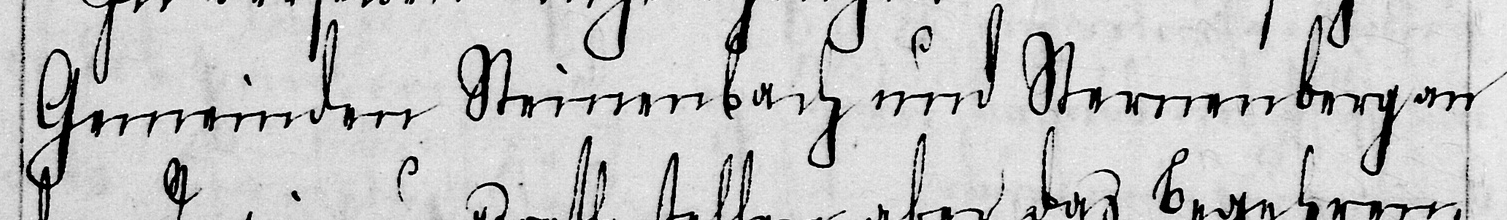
Gemeinden Steinenbach und Sternenberg an
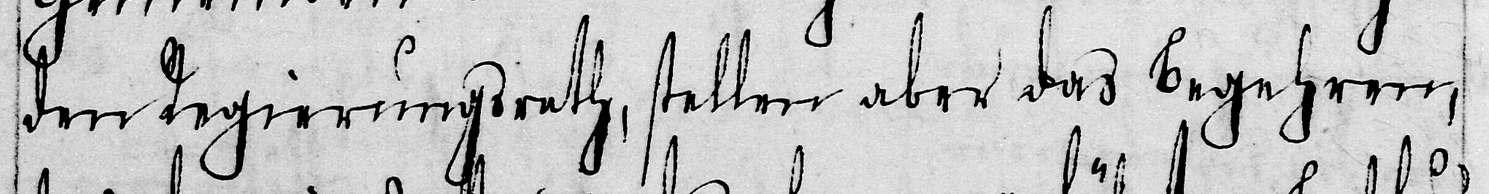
den Regierungsrath, stellen aber das Begehren,
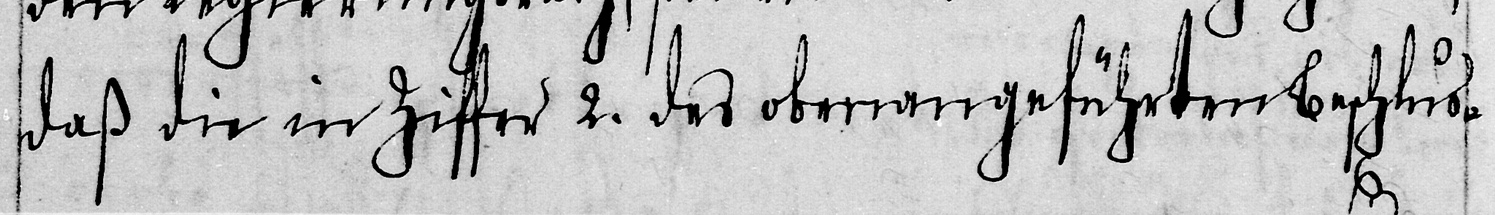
daß die in Ziffer 2. des obenangeführten Beschlu¬
